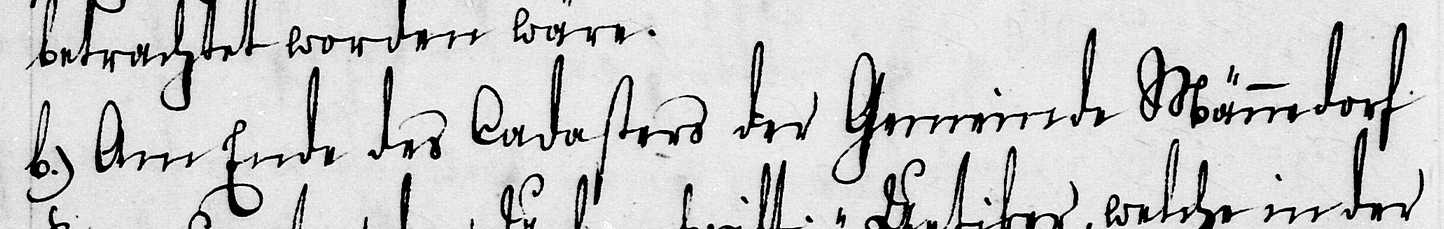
b.) Am Ende des Cadasters der Gemeinde Männedorf
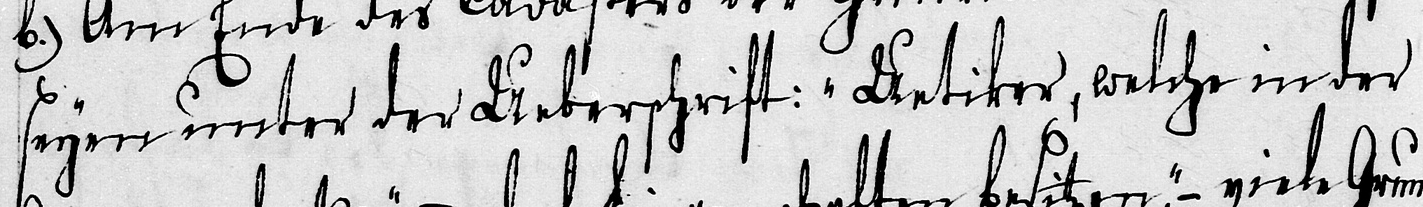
seyen unter der Ueberschrift: „Uetiker, welche in der
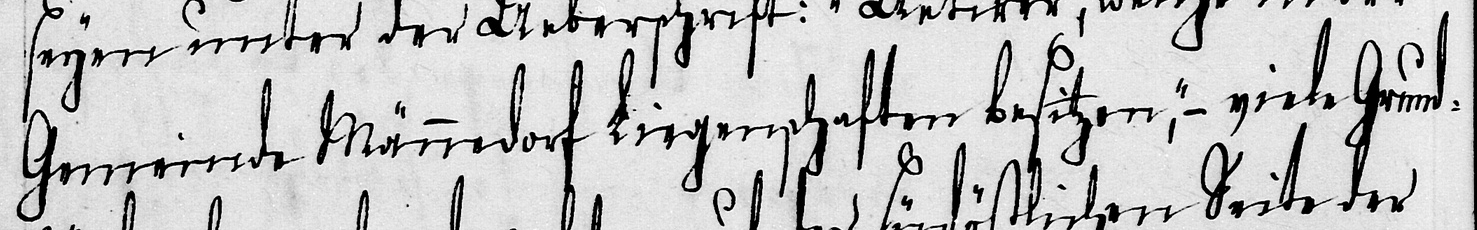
Gemeinde Männedorf Liegenschaften besitzen“, – viele
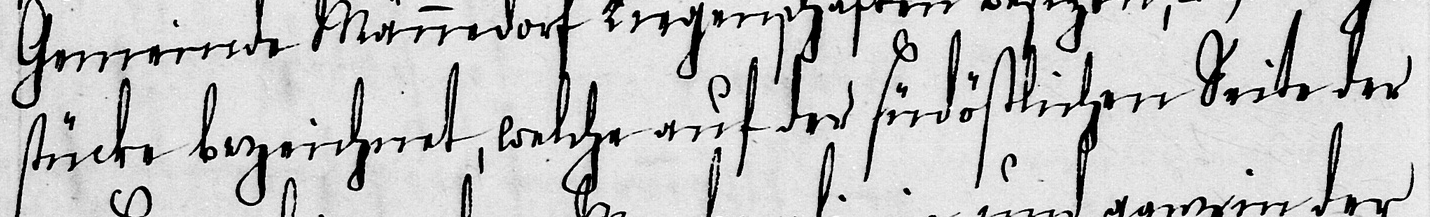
stücke bezeichnet, welche auf der südöstlichen Seite der
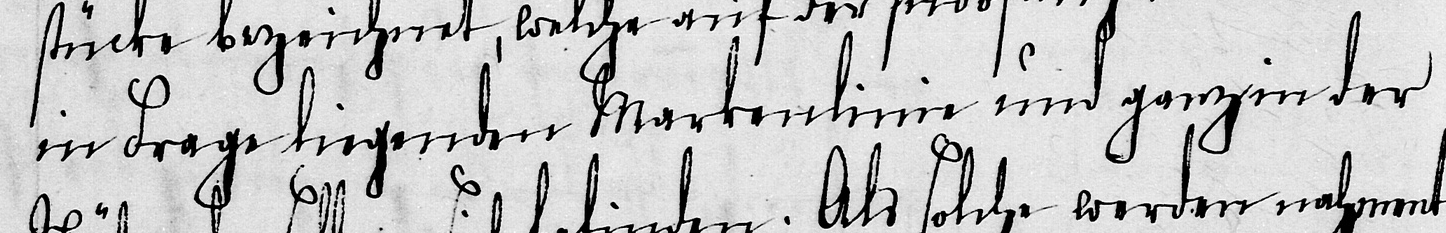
in Frage liegenden Markenlinie und ganz in der
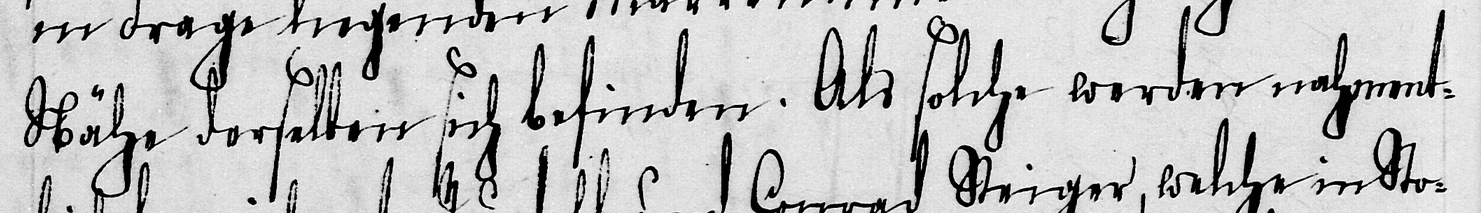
Nähe derselben sich befinden. Als solche werden nahment¬
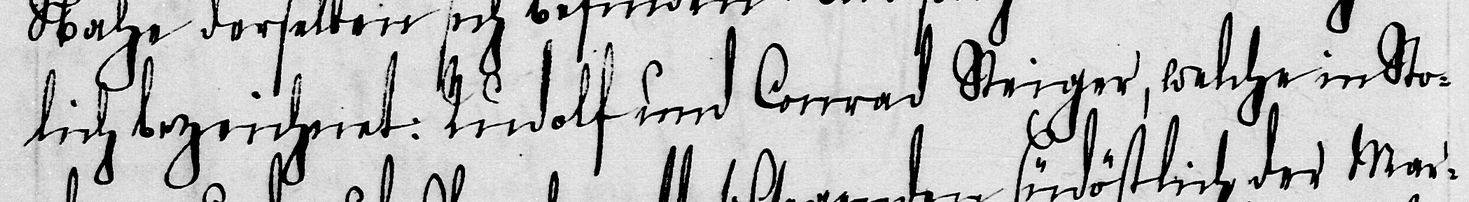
lich bezeichnet: Rudolf und Conrad Steiger, welche in Sto¬
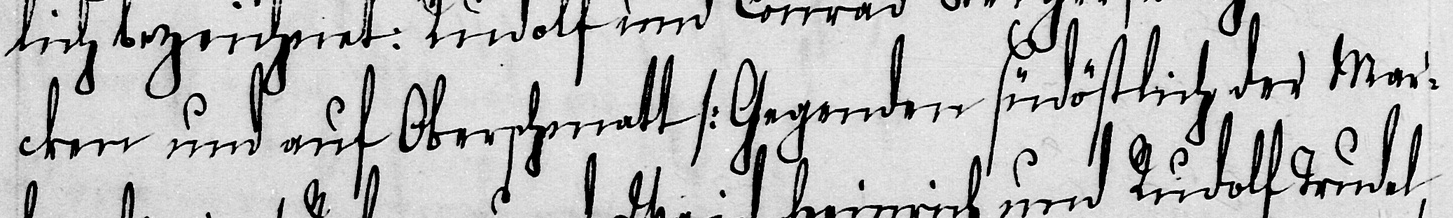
cken und auf Oberschmatt [Gegenden südöstlich der Mar¬
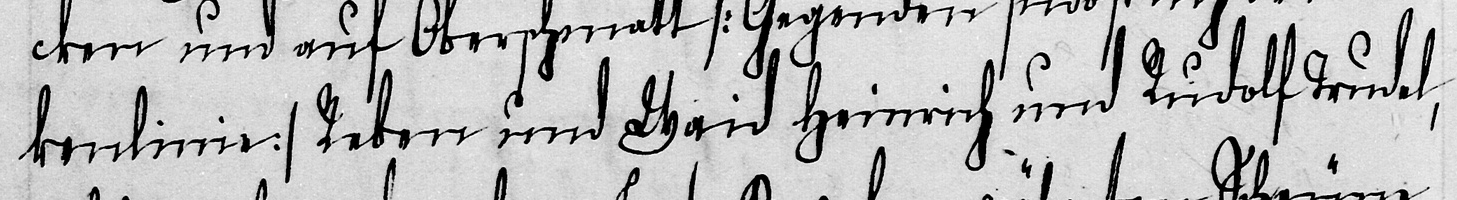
kenlinie] Reben und Waid Heinrich und Rudolf Trudel,
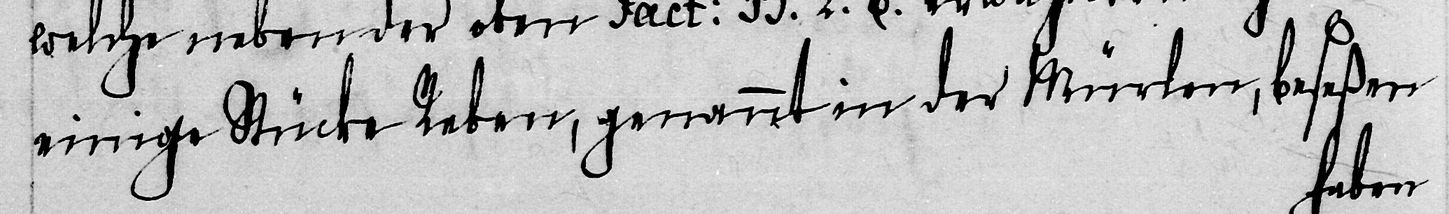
einige Stücke Reben, genannt in der Mürlen, beseßen
